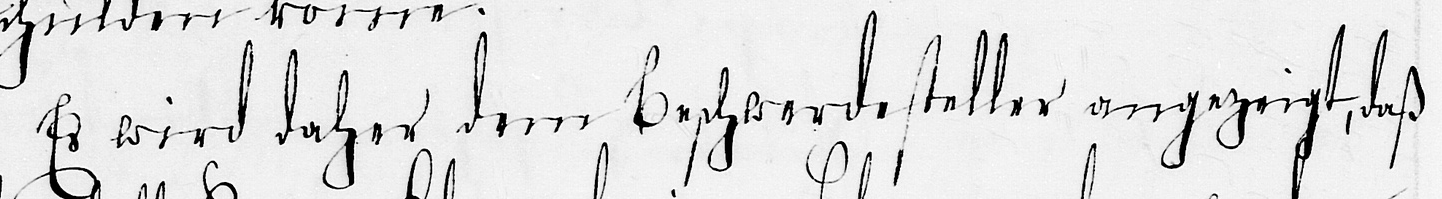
Es wird daher dem Beschwerdesteller angezeigt, daß
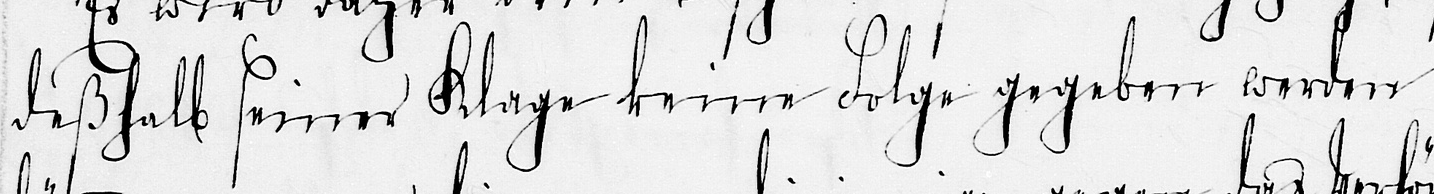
deßhalb seiner Klage keine Folge gegeben werden
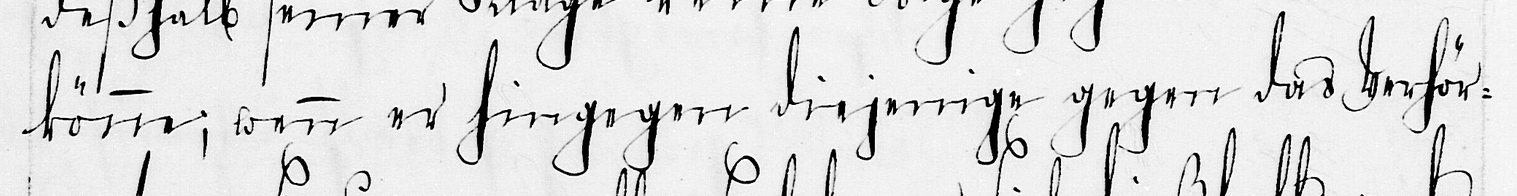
könne, wenn er hingegen diejenige gegen das Verhör¬
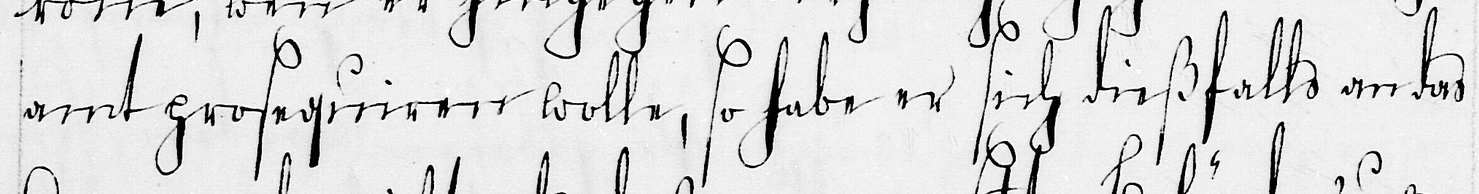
amt prosequiren wolle, so habe er sich dießfalls an das
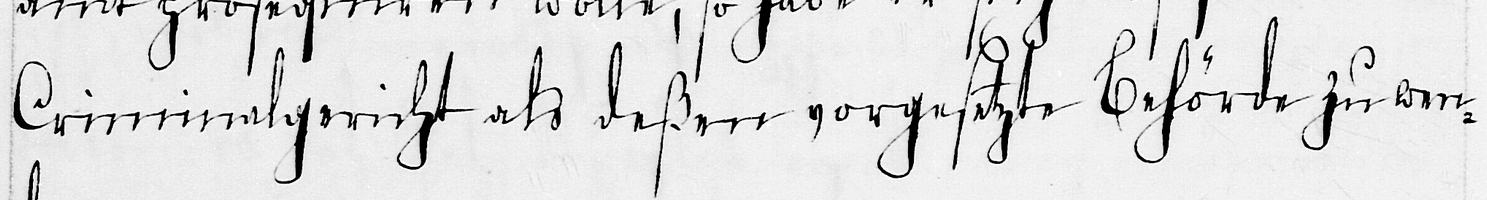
Criminalgericht als deßen vorgesetzte Behörde zu wen¬
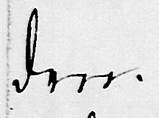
den.
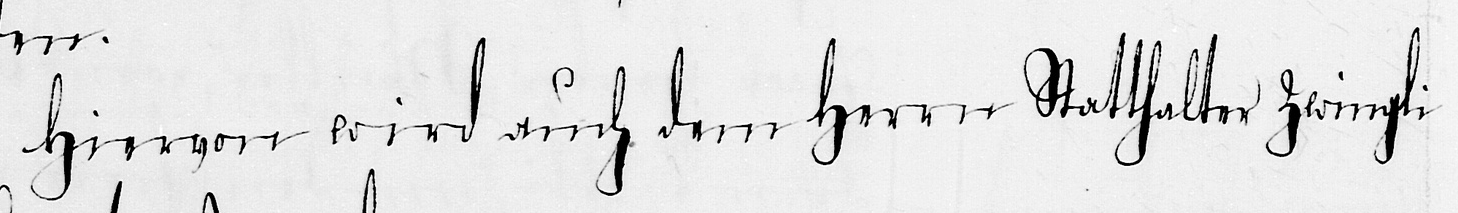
Hiervon wird auch dem Herrn Statthalter Zwingli
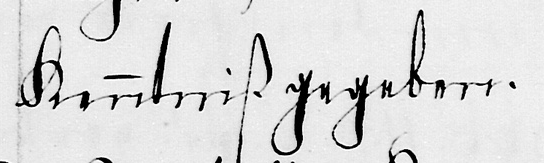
Kenntniß gegeben.
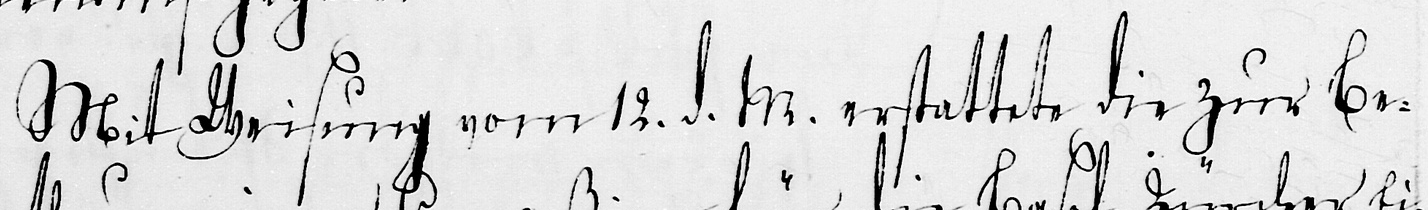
Mit Weisung vom 12. d. M. erstattete die zur Be¬
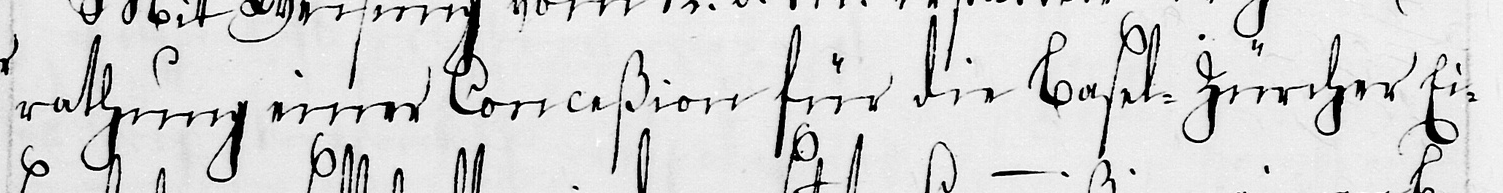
rathung einer Conceßion für die Basel-Zürcher Ei¬
